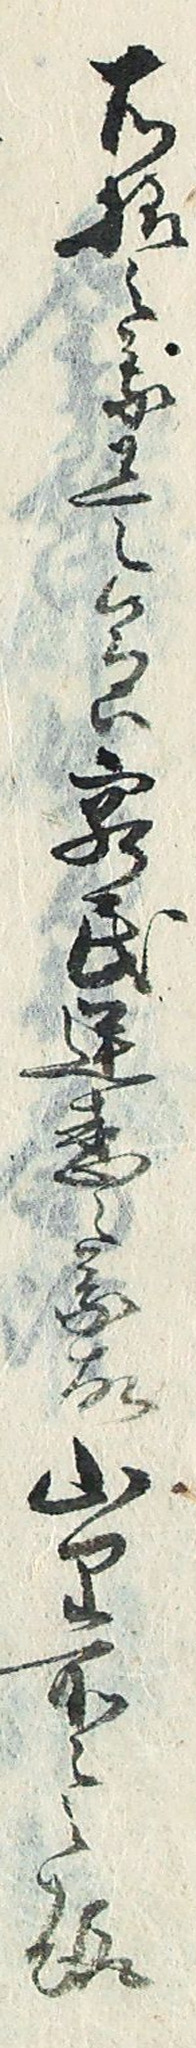左様之義有之候而ハ窮民迷惑之義故山里所々之趣
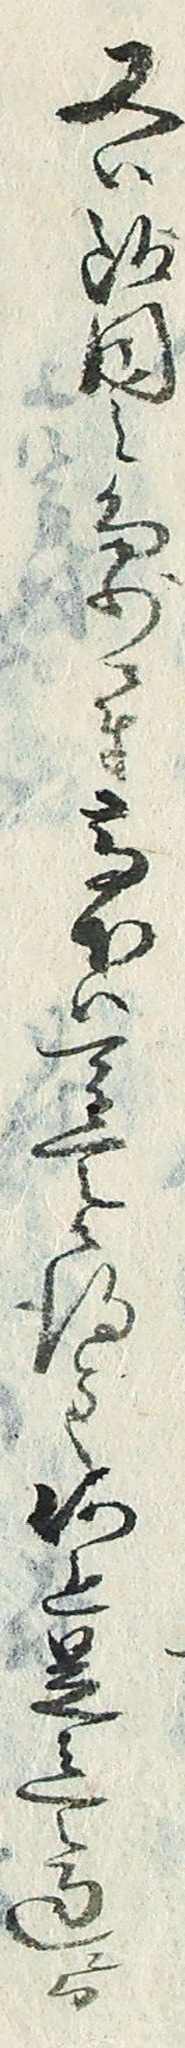又ハ銀用之多少ニ付高下ハ可有之候得とも何れ是迄之通ニ而
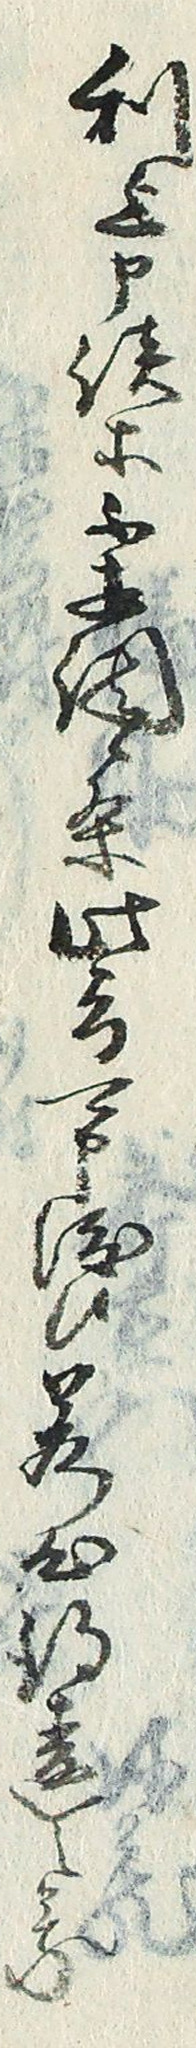利上申談等不相調候条此旨可申渡候若心得違之義
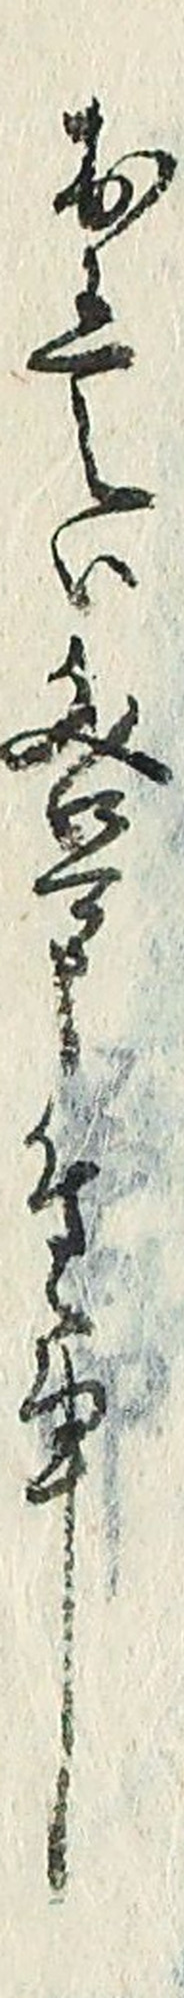於有之ハ咎可申付候事
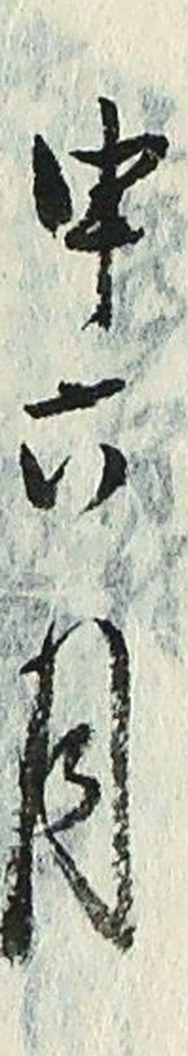申六月
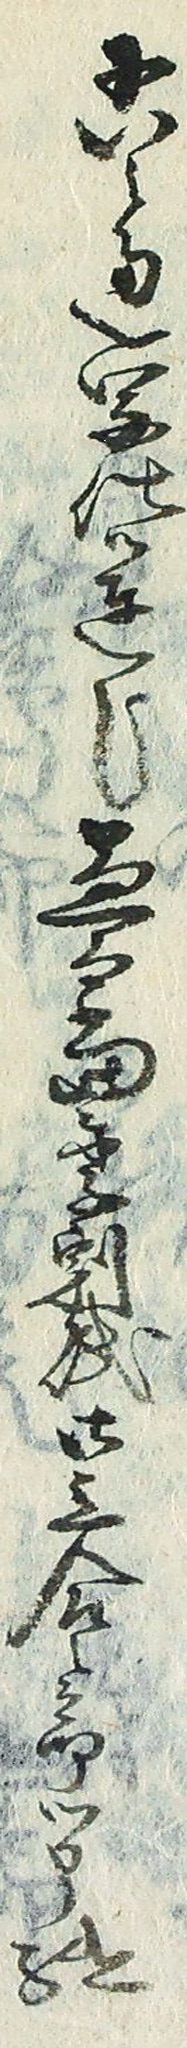右之通写仕御達申候兼而當季割賦御立合之節御申継
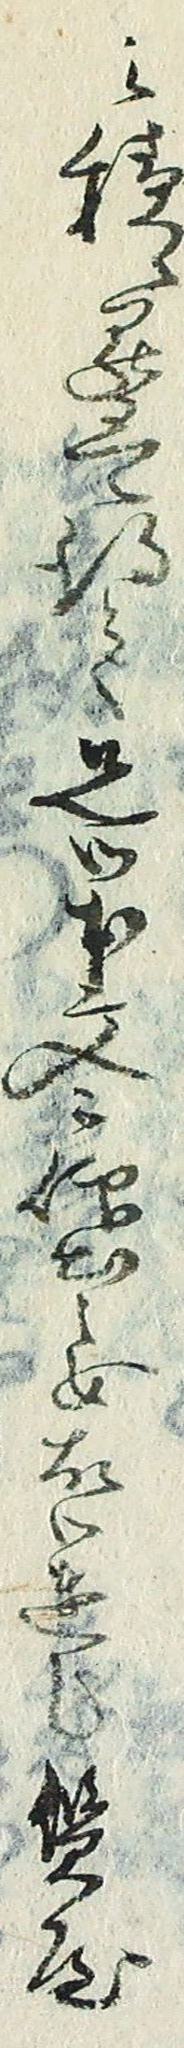之積り罷有候得とも是御本文被仰出之義故御達申候質屋
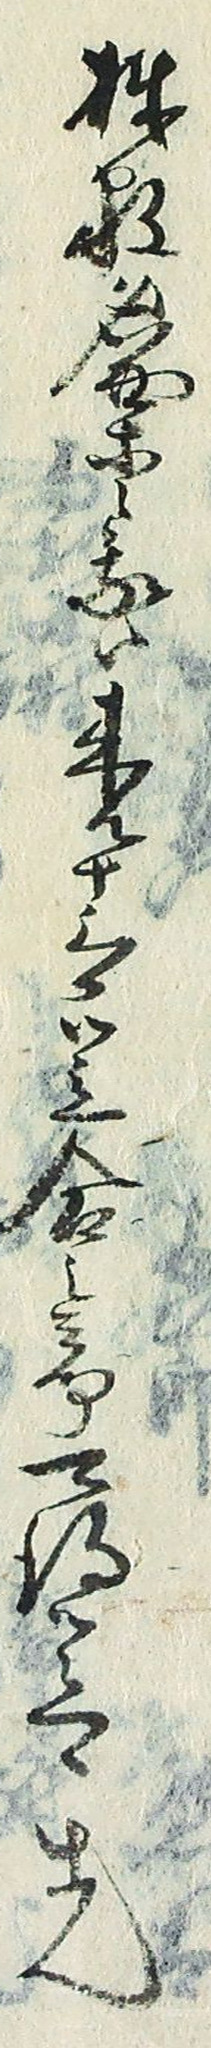株数名面等之義ハ来ル十三日御立合之節可得御意候先
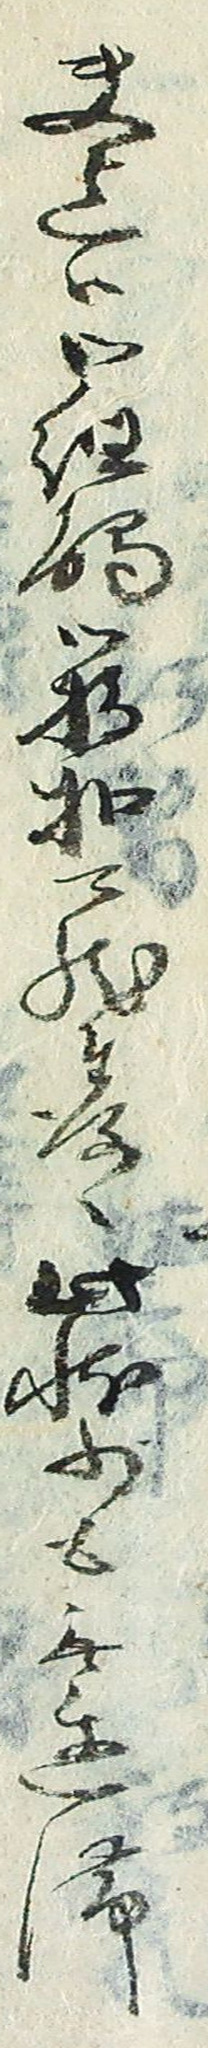夫迄ハ御組觸御指扣可然奉存候此状少も無遅滞
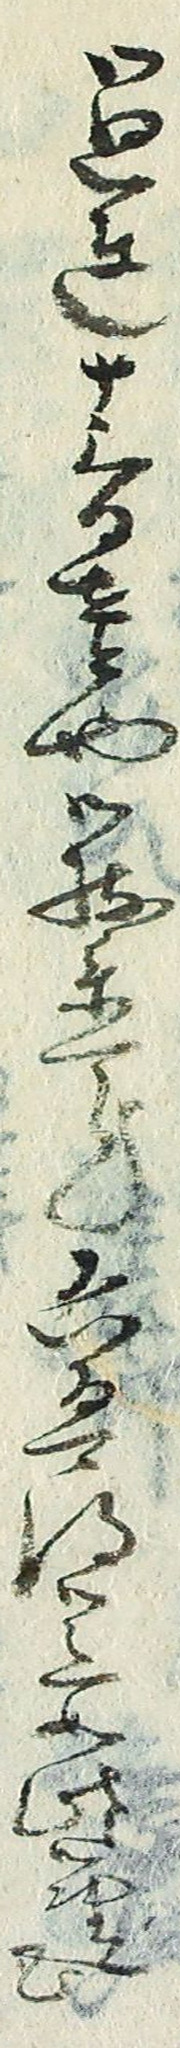御廻達十三日せとや御持参可被下候仍而可得御意如此御座候已上
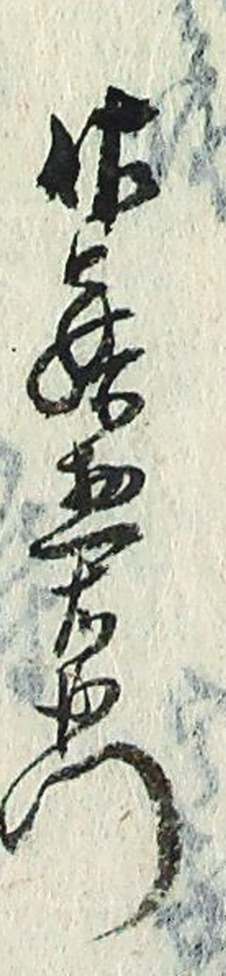佐藤惣右衛門
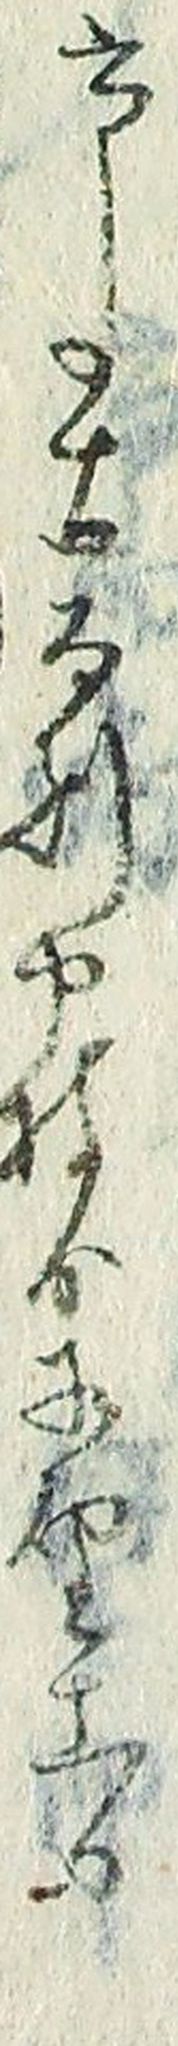六月十日酉刻中村ゟ相届十一日
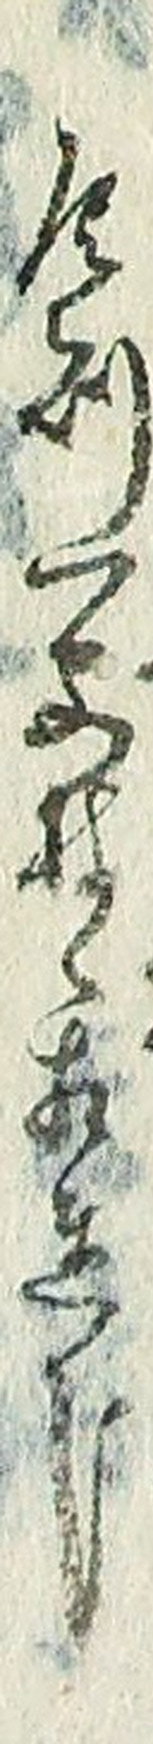辰刻一宮村へ相達申候

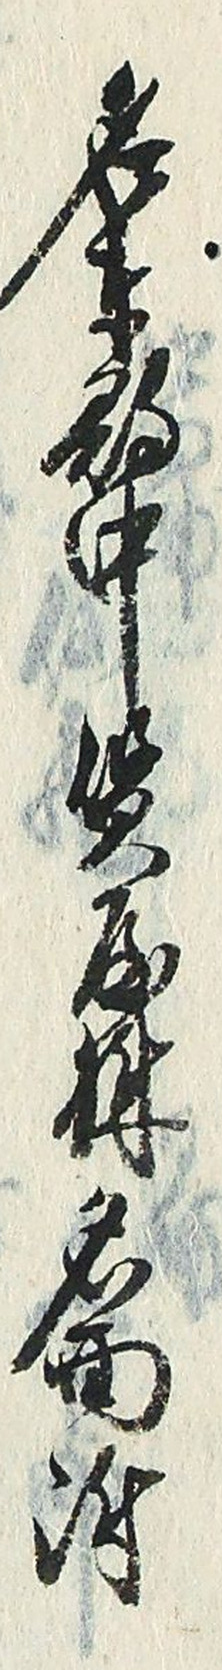名東郡中質屋株名面附

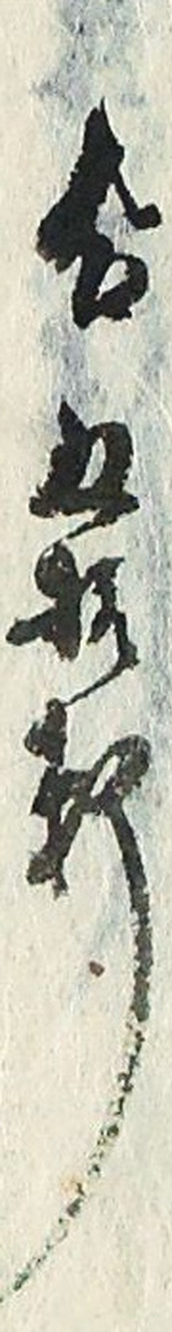合五拾軒
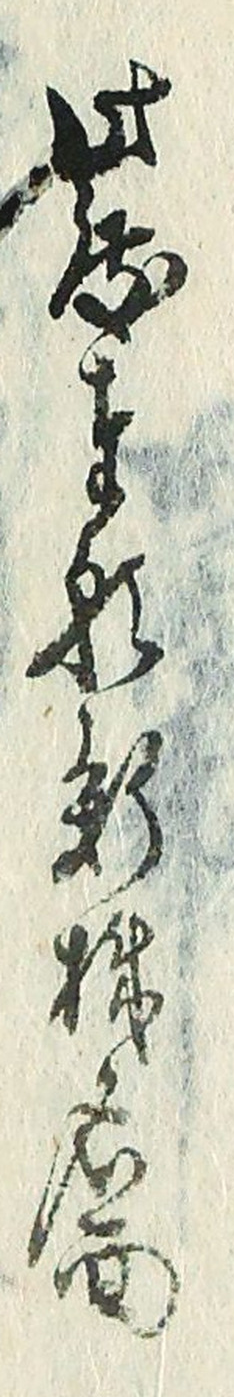此度奉願新株名面
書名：市郷質屋株御取究並御書出御趣法之写
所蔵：鳴門教育大学 Naruto University of Education
